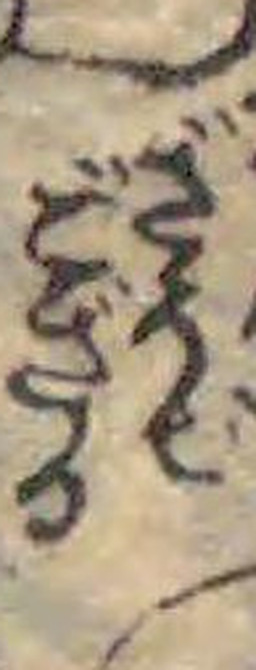ござる
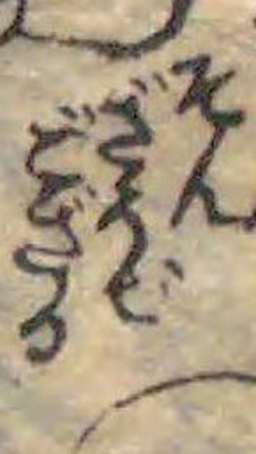ござる
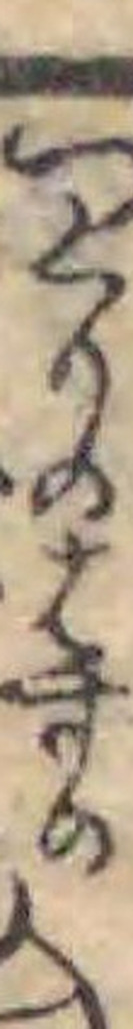つくりのはすの
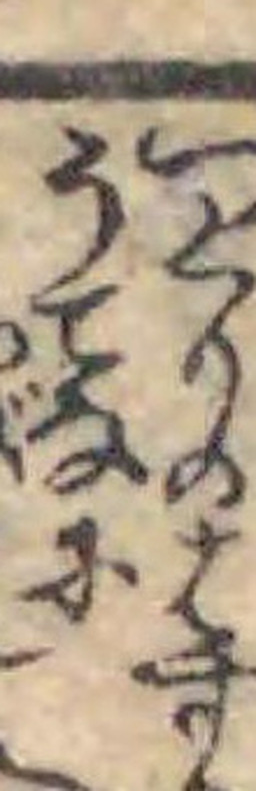うてなに
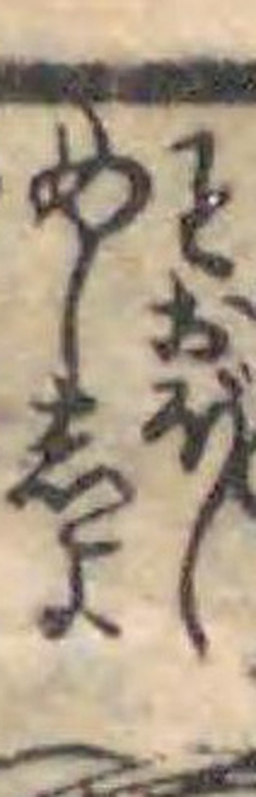めししよ
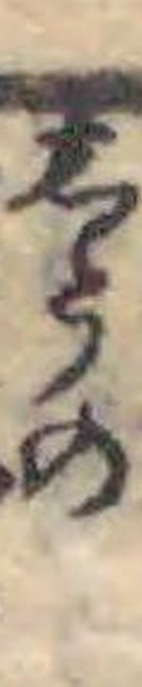しうの
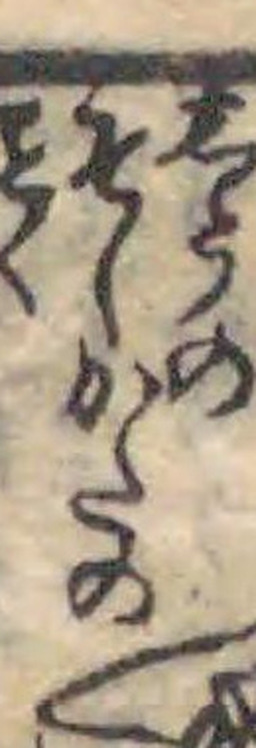そしかたの
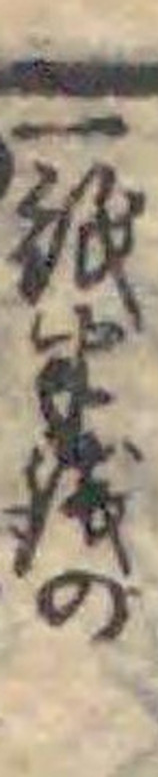一銭半銭の
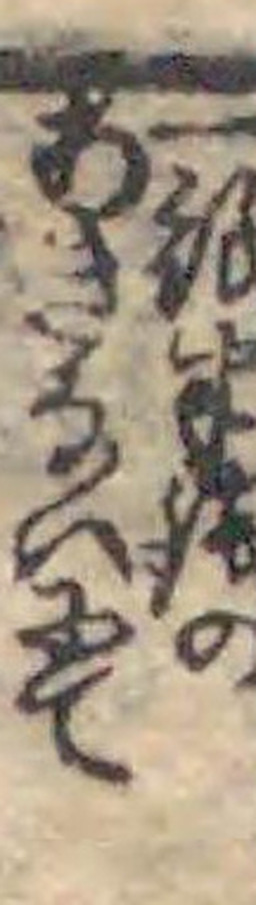あきないにて
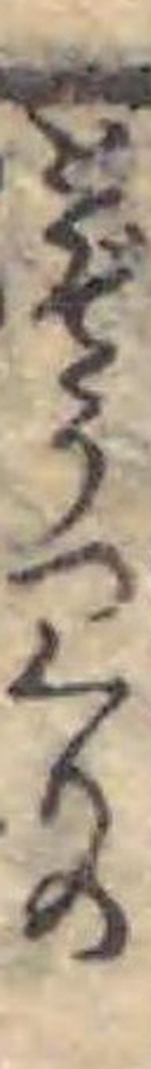とぞうつくりの
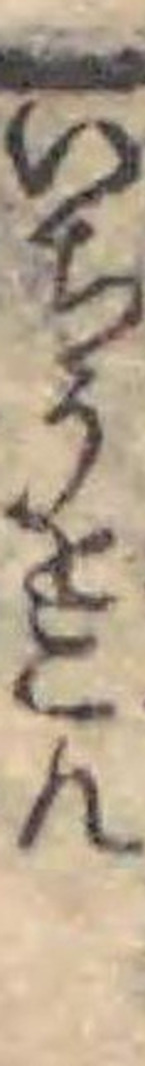いちうをこん
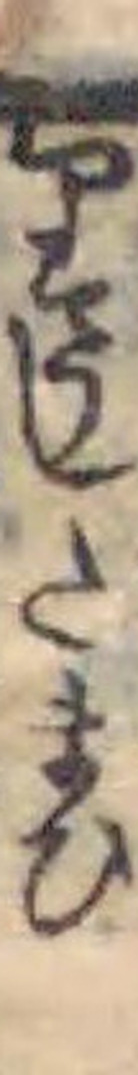りうしたまひ
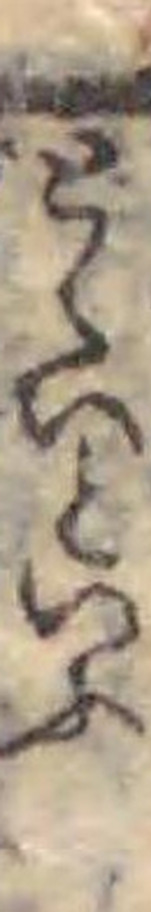とくいといふ
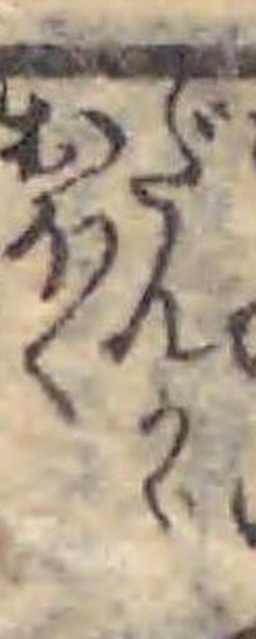おほく
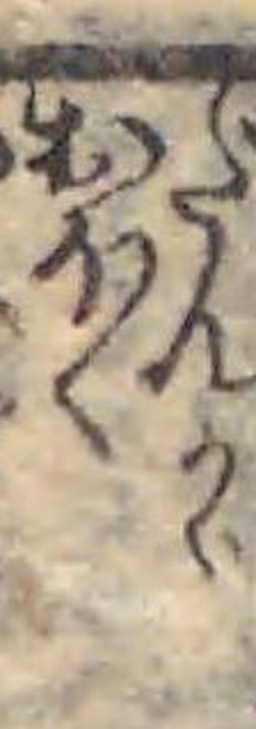おほく
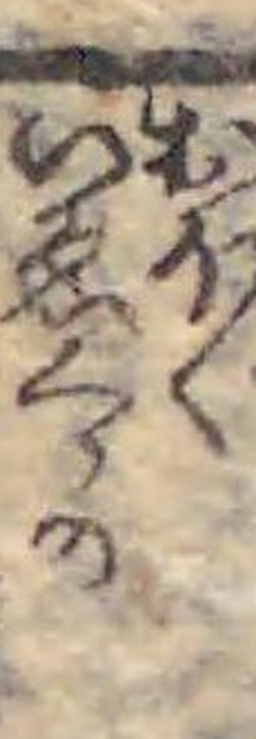いゑくりの
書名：身体開帳略縁起 : 3巻
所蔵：国立国会図書館 National Diet Library, JAPAN
